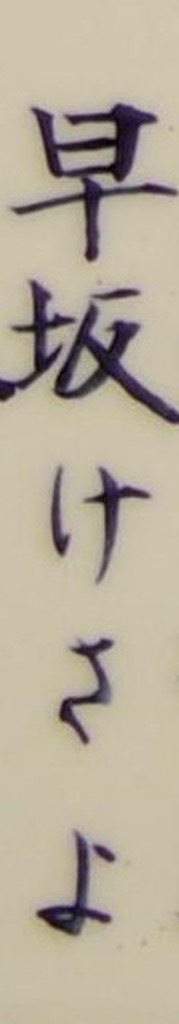早坂けさよ
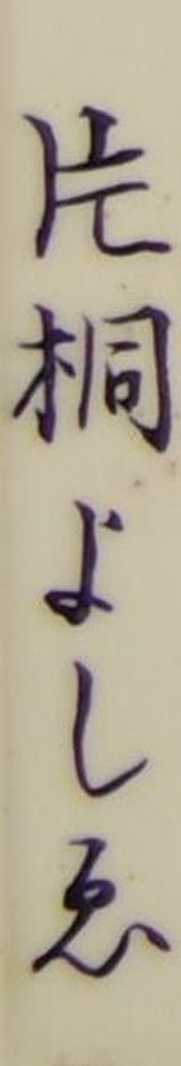片桐よしゑ

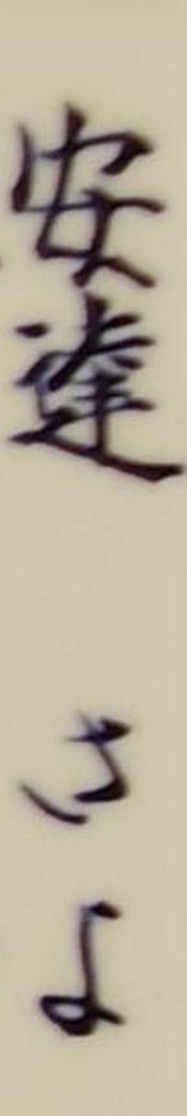安達さよ
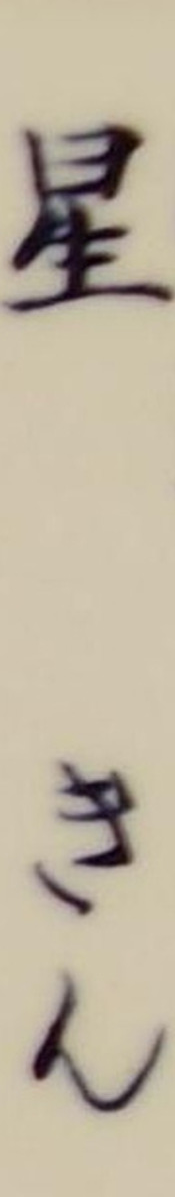星きん
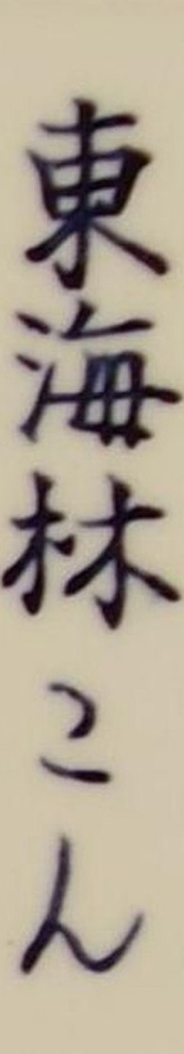東海林こん
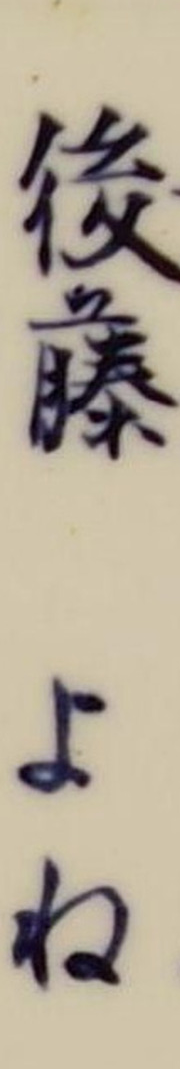後藤よね
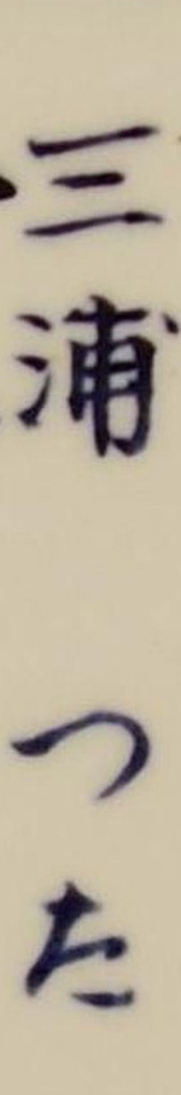三浦つた
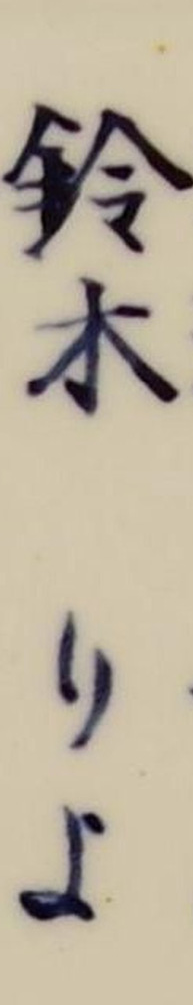鈴木りよ
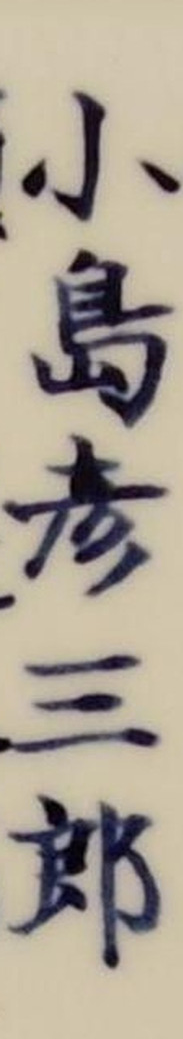小島彦三郎
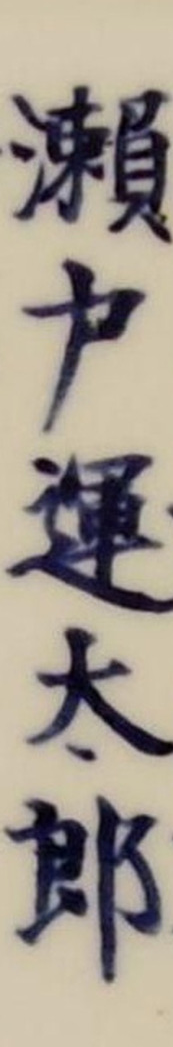瀬戸運太郎
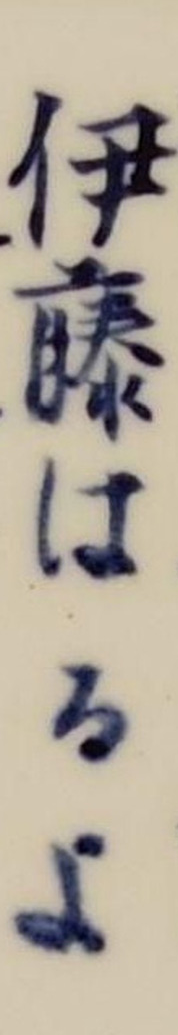伊藤はるよ
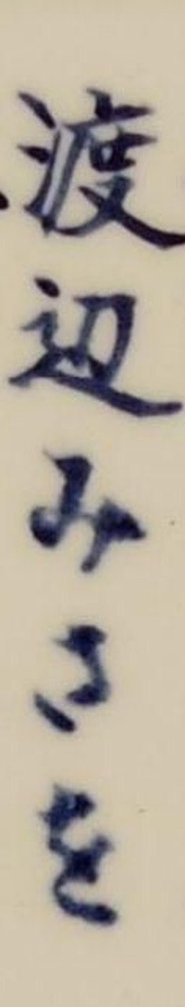渡辺みさを
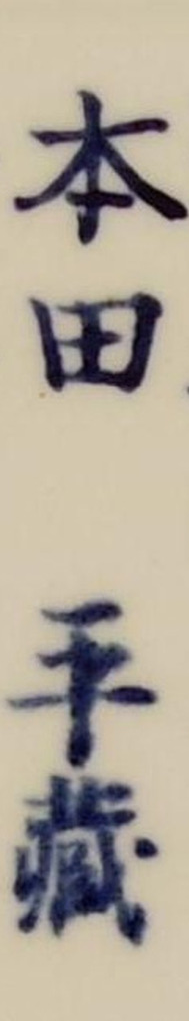本田平蔵
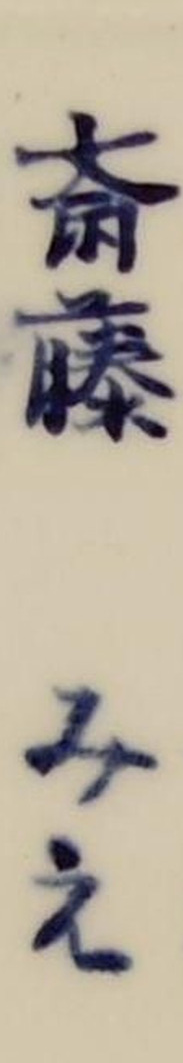斉藤みえ
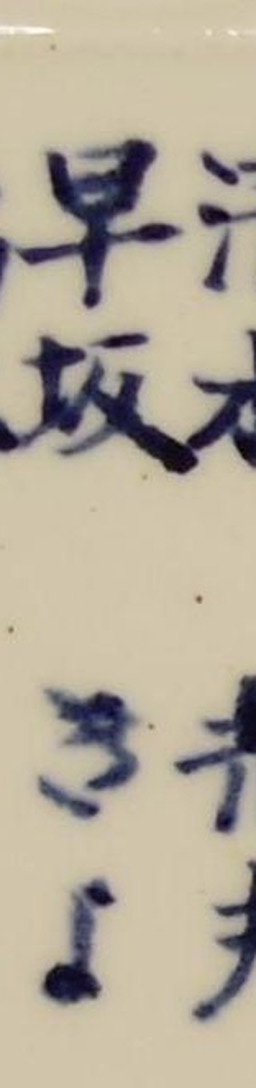早坂きよ
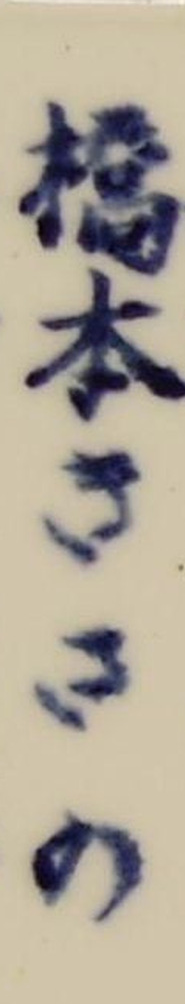橋本きさの
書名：A~D
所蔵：koyasan kongobuji
